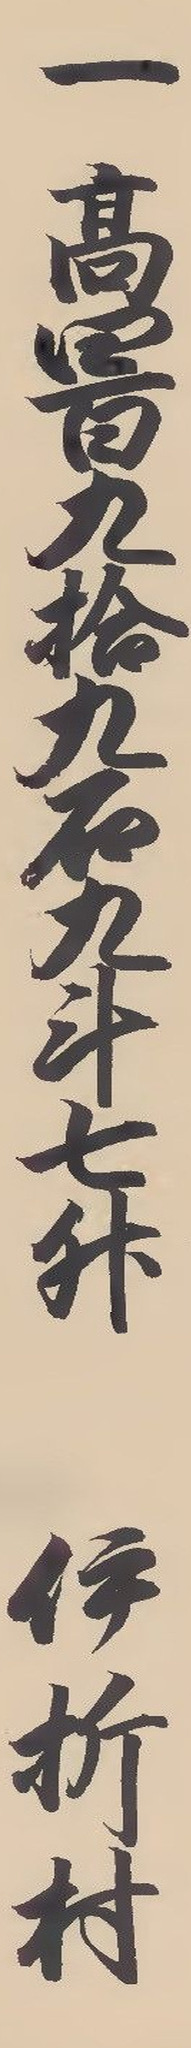一高四百九拾九石九斗七升伊折村
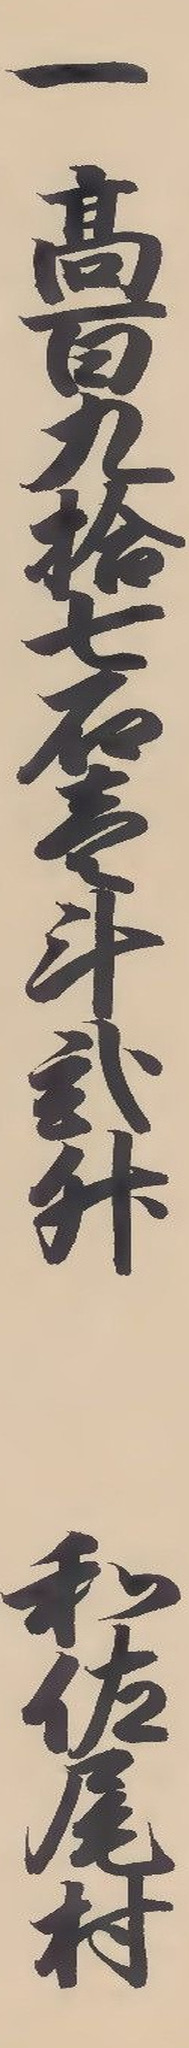一高百九拾七石壱斗弐升和佐尾村
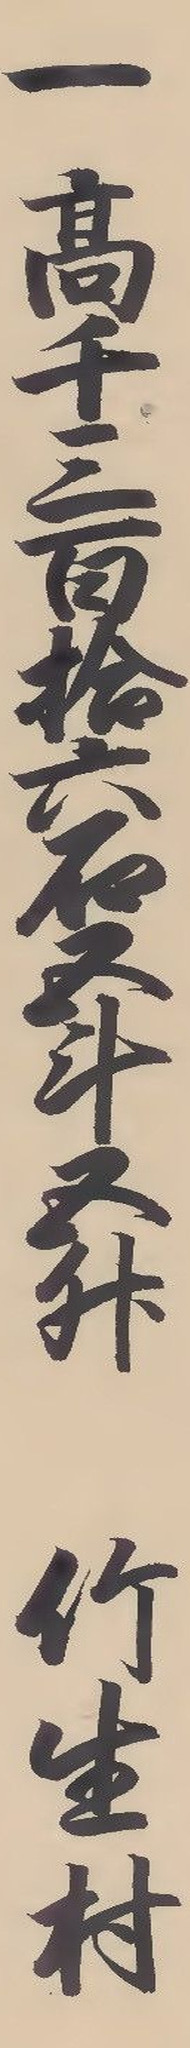一高千三百拾六石五斗五升竹生村
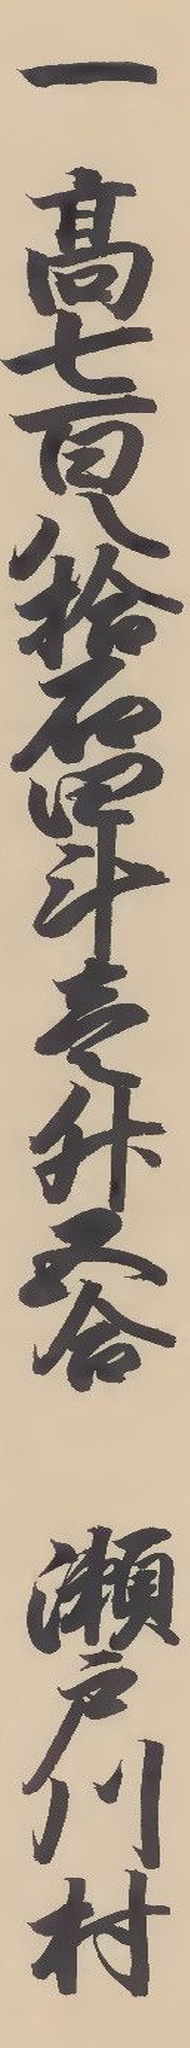一高七百八拾石四斗壱升五合瀬戸川村
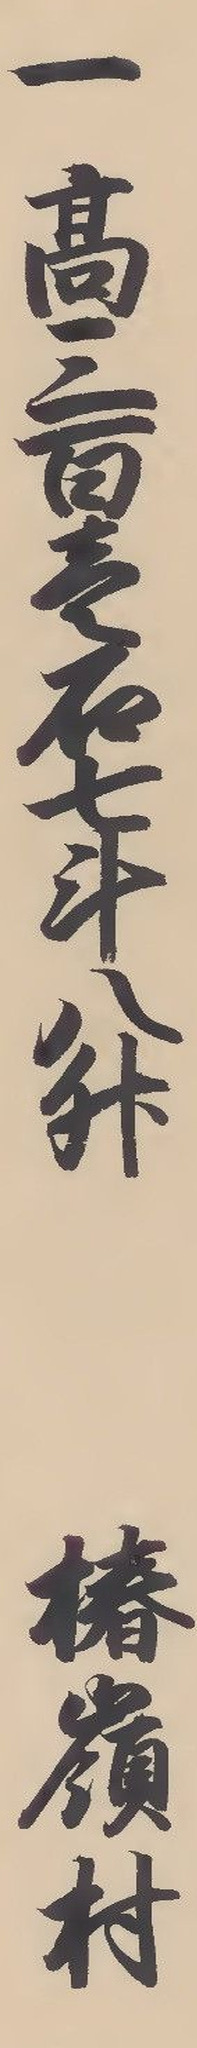一高三百壱石七斗八升椿嶺村

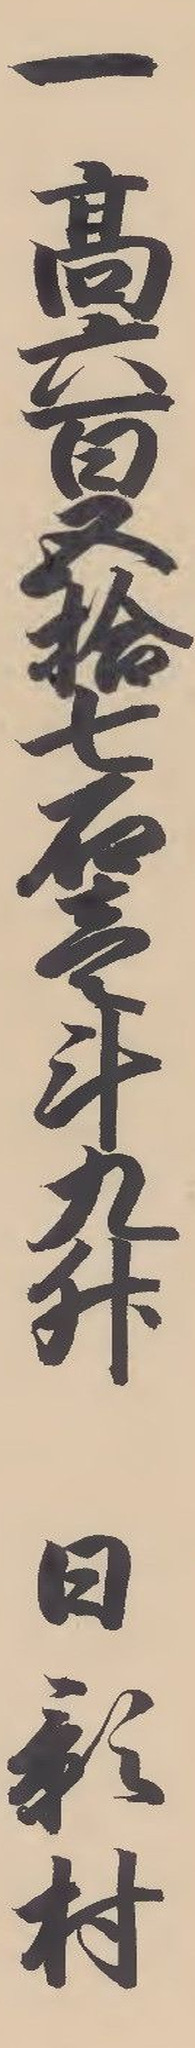一高六百五拾七石壱斗九升日影村
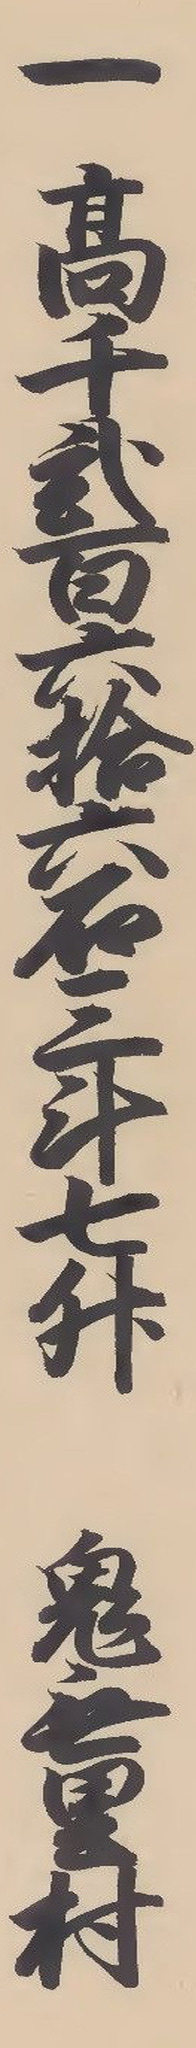一高千弐百六拾六石三斗七升鬼無里村
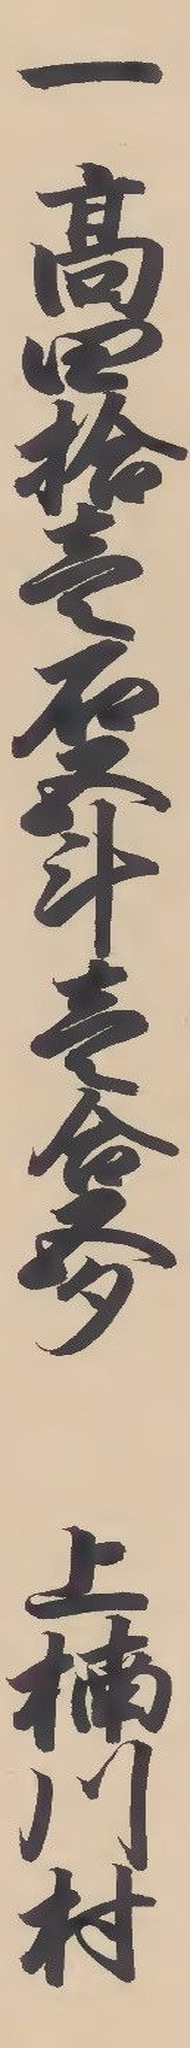一高四拾壱石五斗壱合五勺上楠川村
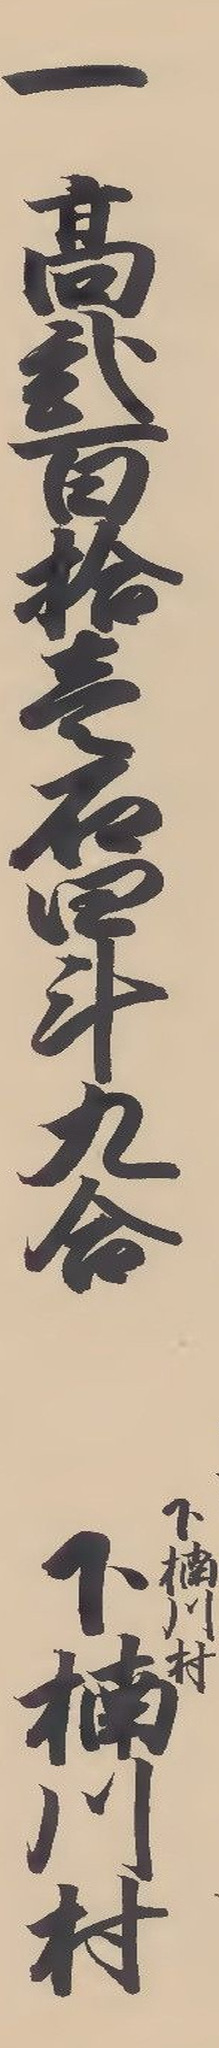一高弐百拾壱石四斗九合下楠川村
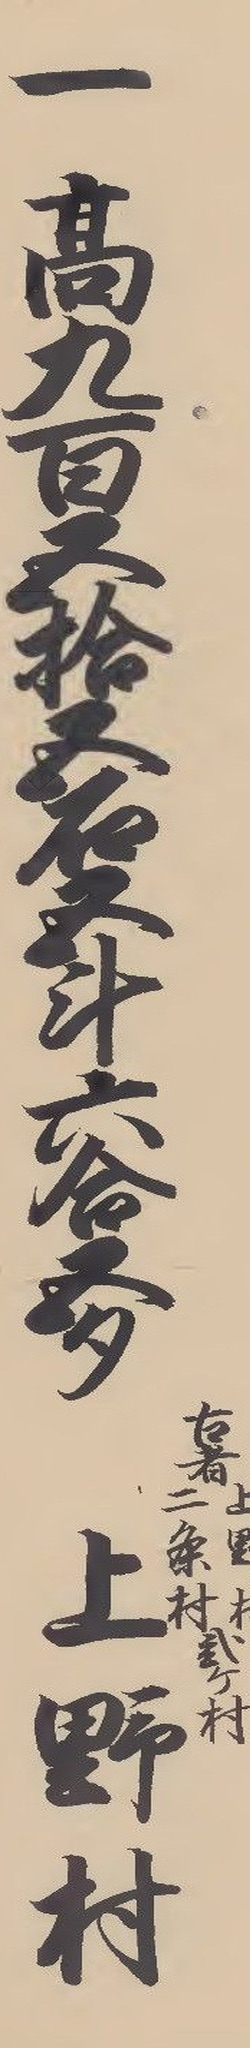一高九百五拾五石五斗六合五勺上野村
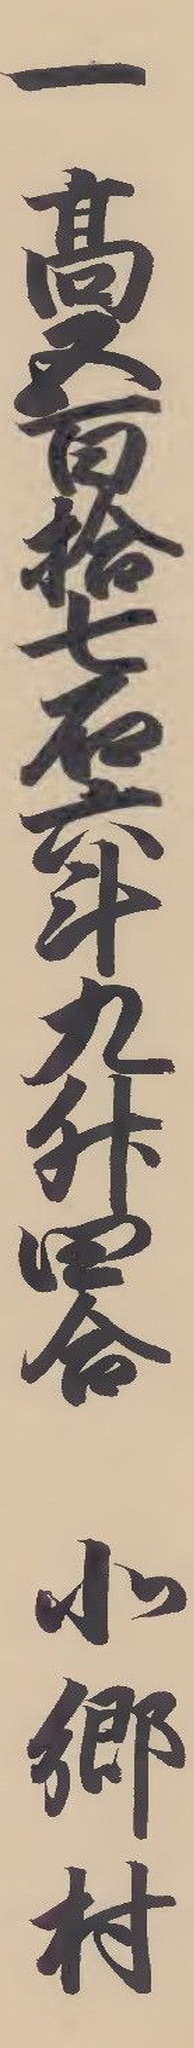一高五百拾七石六斗九升四合北郷村
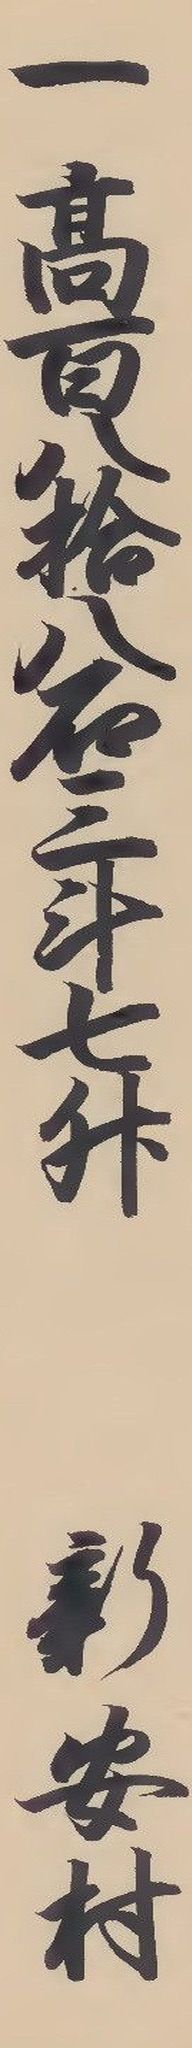一高百八拾八石三斗七升新安村

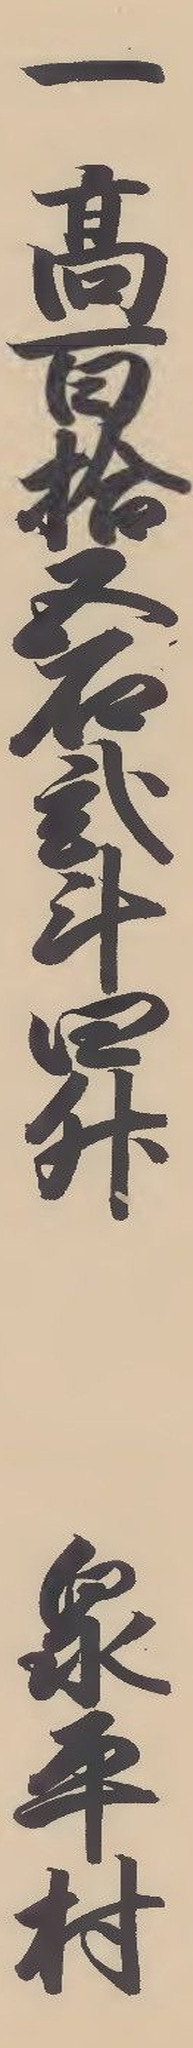一高百拾五石弐斗四升泉平村
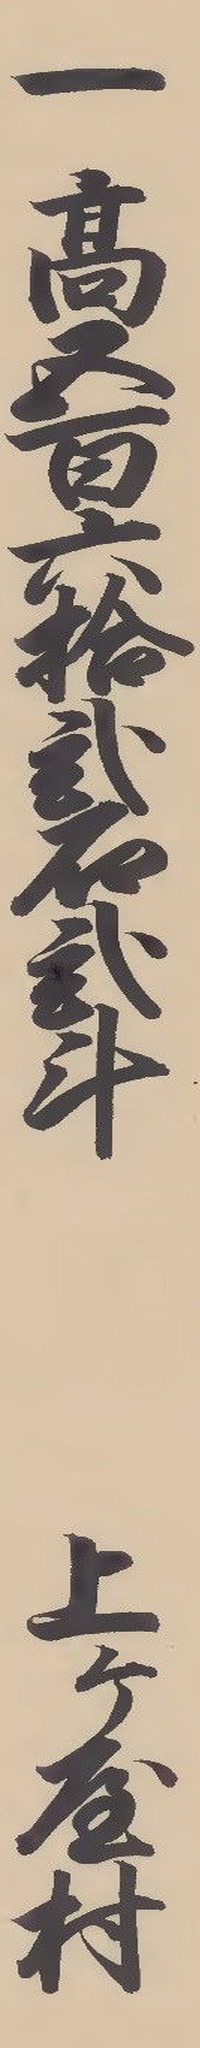一高五百六拾弐石弐斗上ヶ屋村
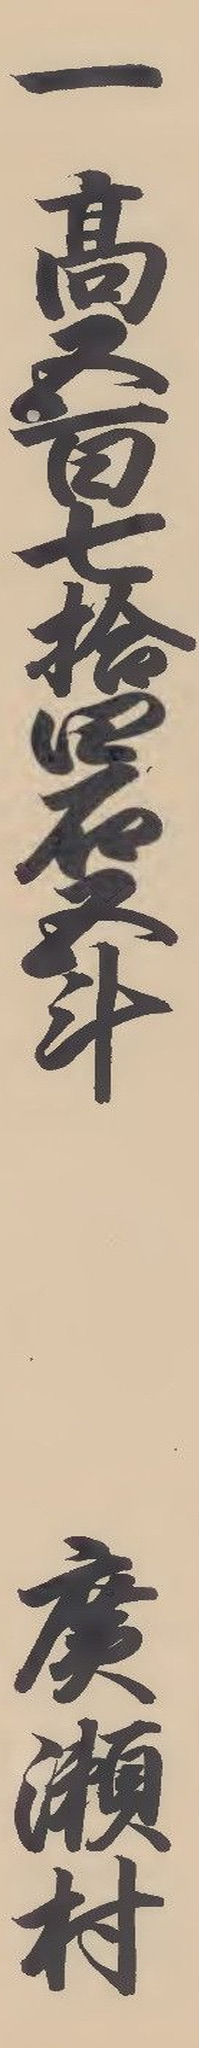一高五百七拾四石五斗広瀬村
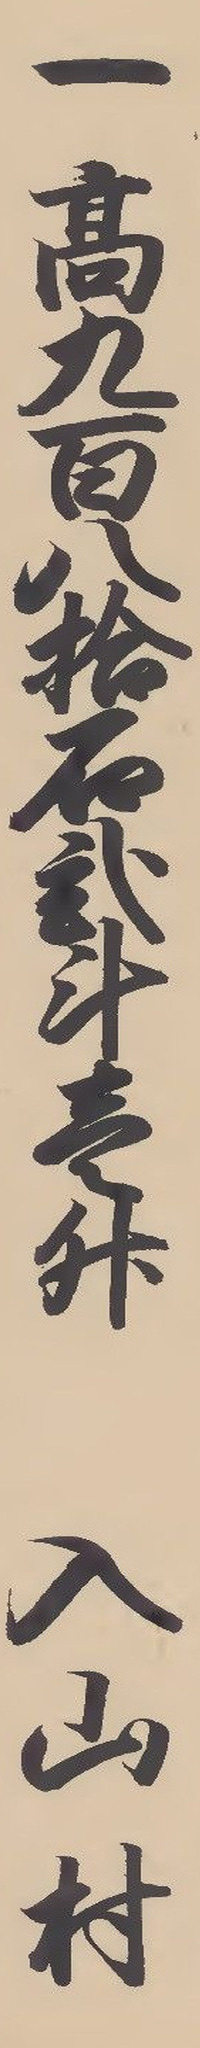一高九百八拾石弐斗壱升入山村
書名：信濃国郷帳
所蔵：国立公文書館 National Archives of Japan
